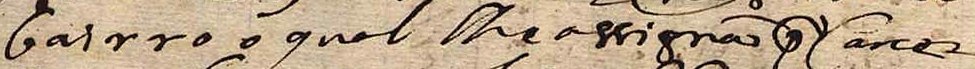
bairro o qual lhe assignão p̄o Cartas
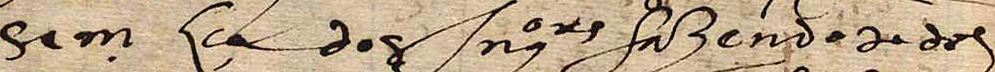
sem Lça dos Jnqors fazendo todos
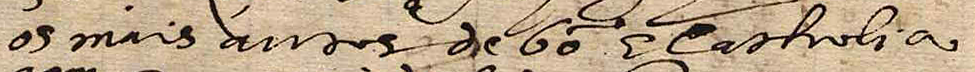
os mais autos de bō E Catholico
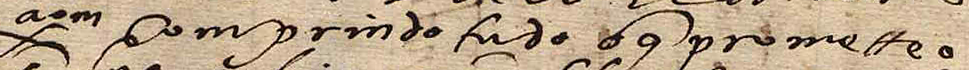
Xaom comprindo tudo o q̄ prometteo
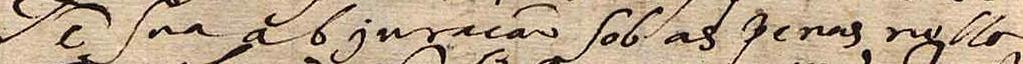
ē sua abjuração sob as penas nella
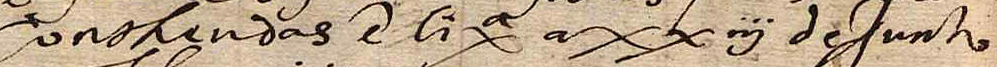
Contheudas ē lixa a xxiij de Junho
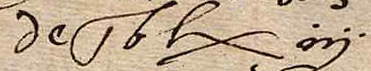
de j̄blxiij
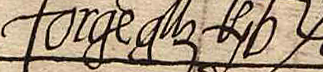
Jorge ḡllz Rybro
